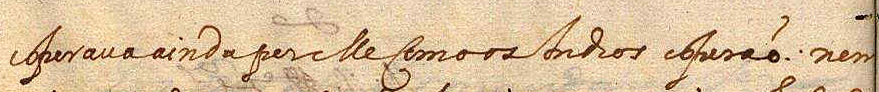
esperaua ainda per elle Como os Iudios esperaõ: nem
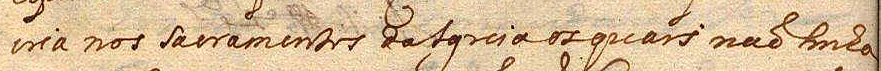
cria nos sacramentos da Igreia os quais naõ tinha
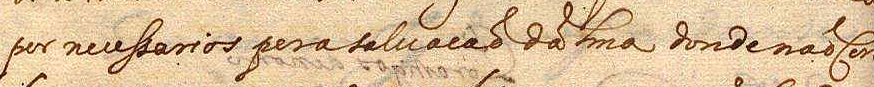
per necessarios pera saluaçaõ dalma donde naõ Con
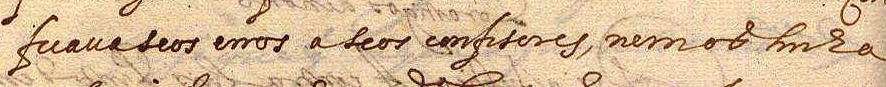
fiçaua seos erros a seos confisores, nem os tinha
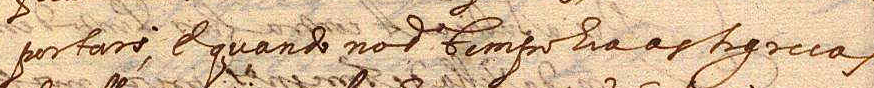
por tais, & quando no do tempo hia as Igreias
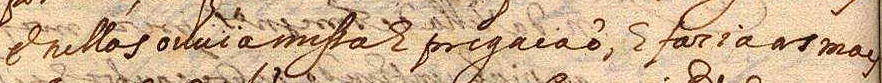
e nellas ouuia missa E pregaçaõ, E fazia as maes
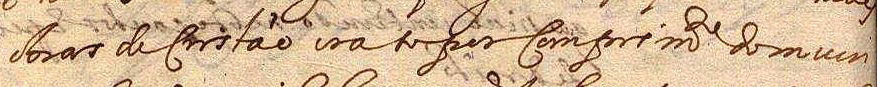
obras de Cristão era so por Comprimto do mun
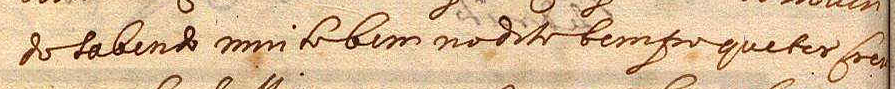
do sabendo muito bem no dito tempo que ter Cren
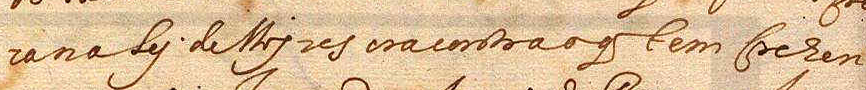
za na Lej de Mojzes era contra o q̄ tem Cre E en
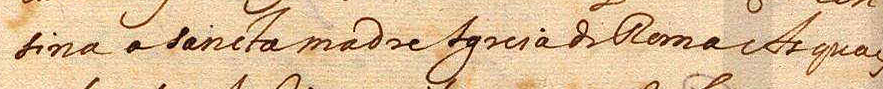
sina a sancta madre Igreia de Roma As quais
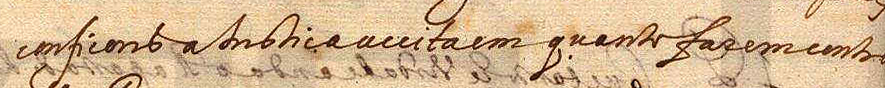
confiçons̄ a Iustiça aceita emquanto fazem contra
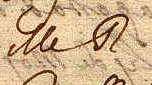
elle R
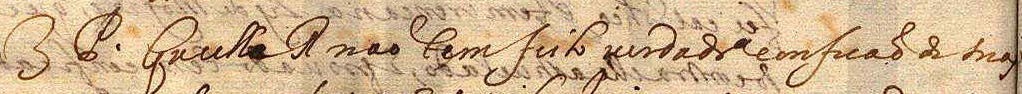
3 P. Que elle R naõ tem feito uerdadra confisaõ de suas
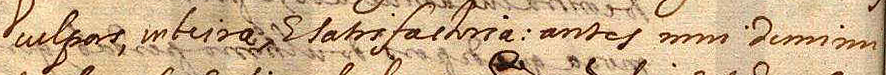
culpas, inteira, E satisfactoria: antes mui deminu
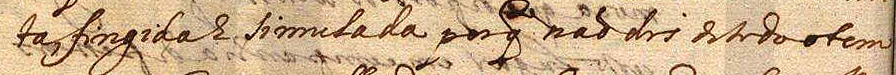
ta, fingida E simulada porq̄to naõ dis de todo o tem
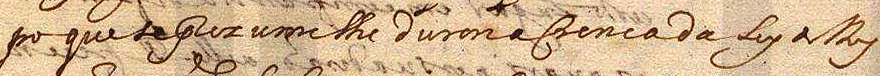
po que se prezume lhe durou a Crença da Ley a Moy
